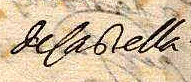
de Castella.
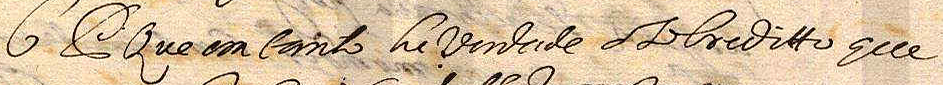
6 P. Que em tanto he verdade o sobreditto que
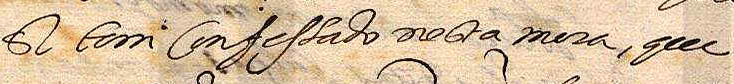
R tem Confessado nesta meza, que
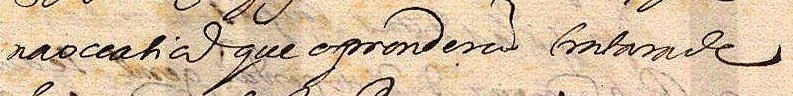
na occasiaõ que o prenderaõ tratara de
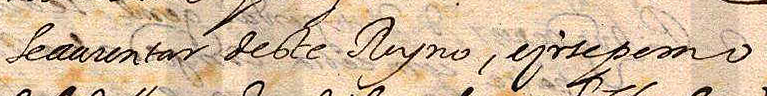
se auzentar deste Reyno, e jrse pera o
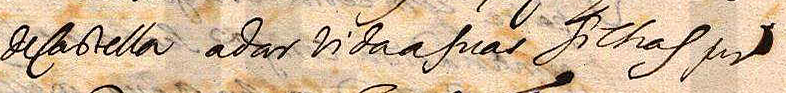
de Castella a dar vida a suas filhas por
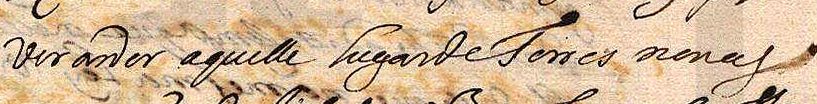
ver arder aquelle lugar de Torres nouas
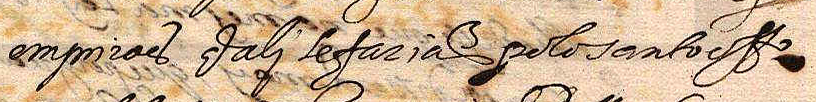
em prizoẽs q̄ alj se faziaõ pelo santo offo
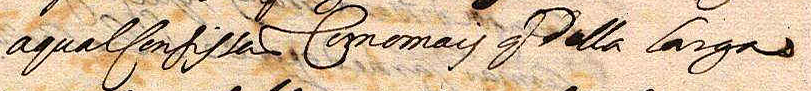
a qual Confissão Com o mais q̄ della larga
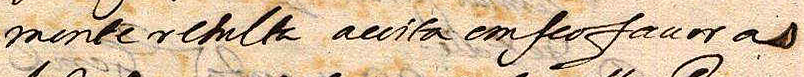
mente resulta aceita em seo fauor a
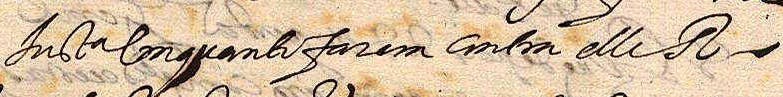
Iusta Emquanto fazem contra elle R.
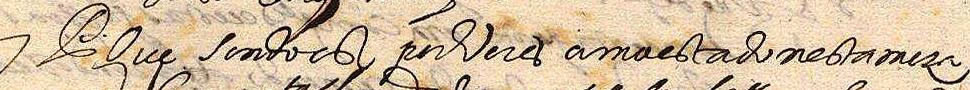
7 P. Que sendo o R por Vezes amoestado nesta meza
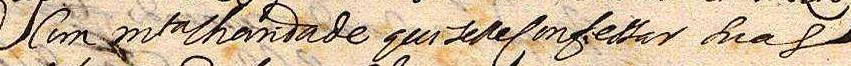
Com mta charidade que se sse Confessar suas
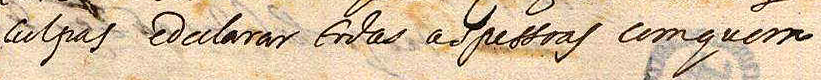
culpas e declarar todas as pessoas com quem
